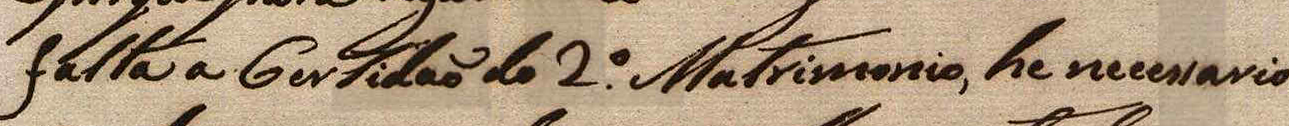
falta a Certidaõ do 2.o Matrimonio, he necessario
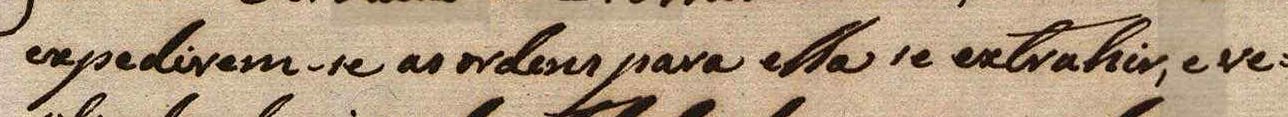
expedirem-se as ordens para ella se extrahir, e ve
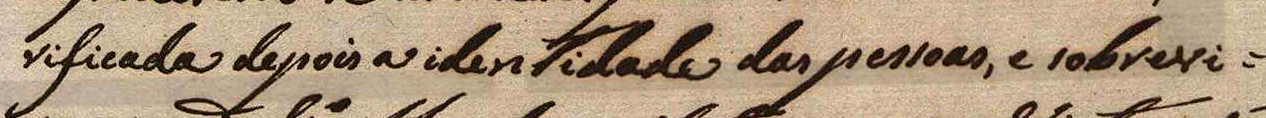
rificada depois a identidade das pessoas, e sobrevi
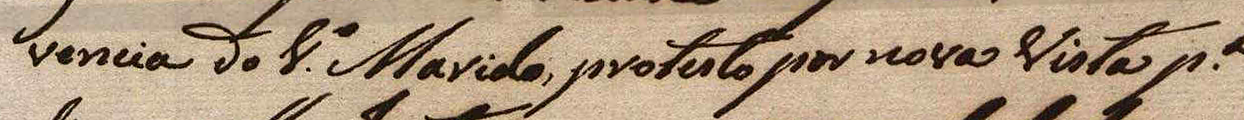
vencia do 1.o Marido, protesto por nova Vista p.a
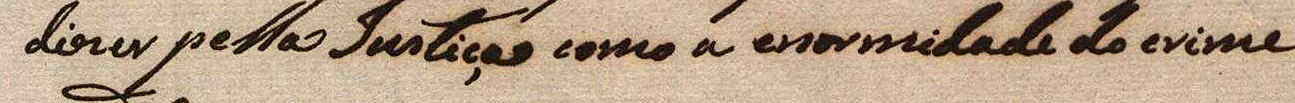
dizer pella Iustiça como a enormidade do crime
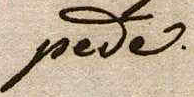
pede.
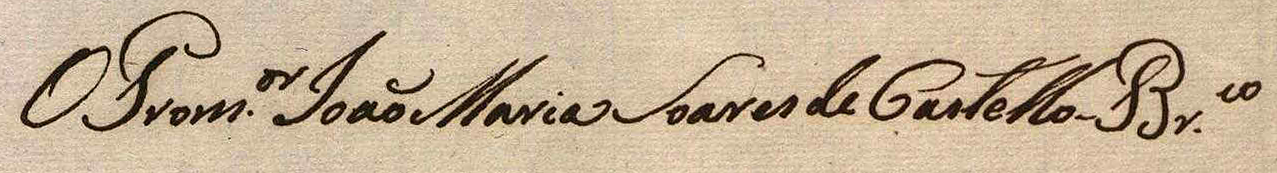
O Prom.or Ioaõ Maria Soares de Castello Br.co
